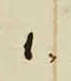1
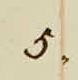5
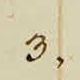3
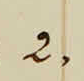2
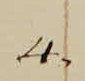4
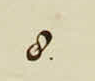8.
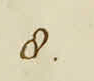8.
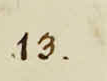13.
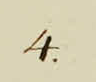4.
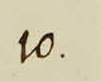10.
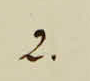2.
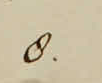8.
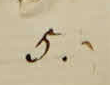5.
